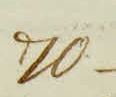70
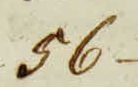56
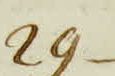29
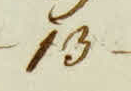13
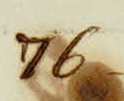76
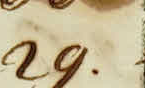29.
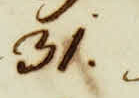31.
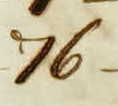76
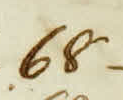68
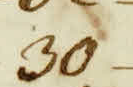30
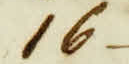16
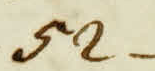52
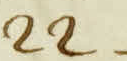22
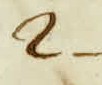2
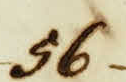56
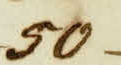50
